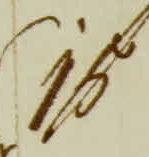15
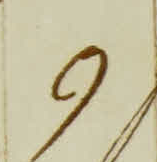9
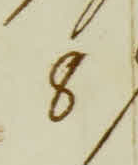8
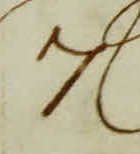7
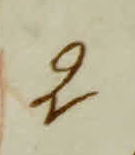2
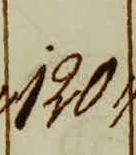120
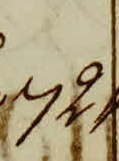72
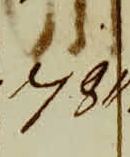78
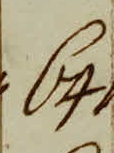64
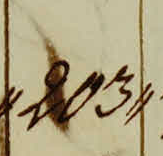203
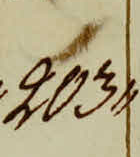203
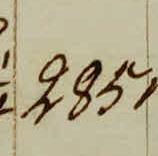285
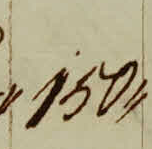150
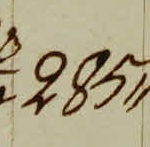285
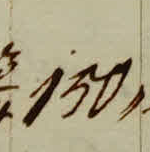150
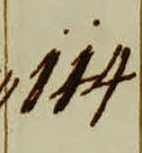114
